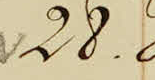28.
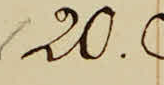20.
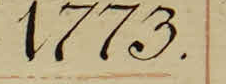1773.
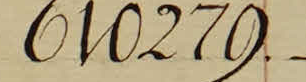610270.
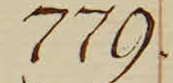779
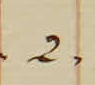2
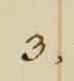3
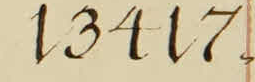13417
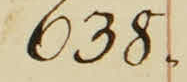638
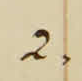2
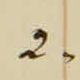2
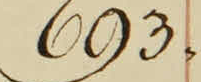693
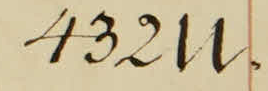43211
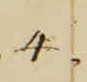4
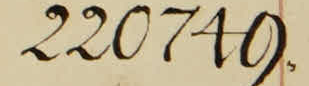220749
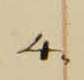4
